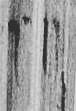川（順）
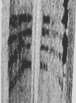天
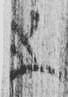之
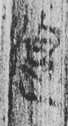道
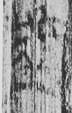○（吾）
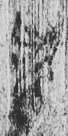○（奚）
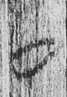㠯（以）
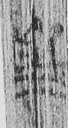爲
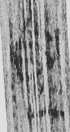頁（首）
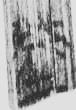𫊟（乎）
